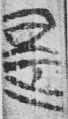是
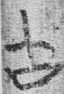古（故）
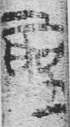聖
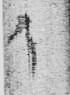人
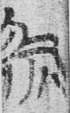○〈凥〉
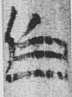於
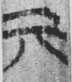亓（其）
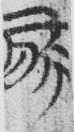所
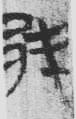邦
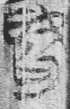既
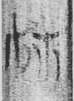○（靡）
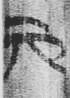亓（其）
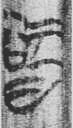智
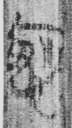愈
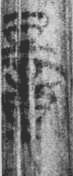暲（彰）
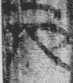亓（其）
